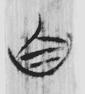自
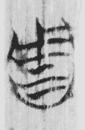周
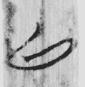㠯（以）
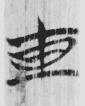車
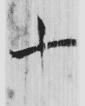七
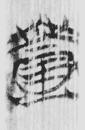{亠舛車}
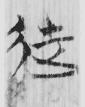徒
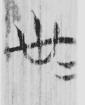丗=
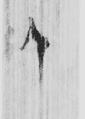人
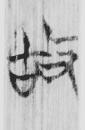故
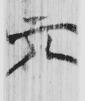亓
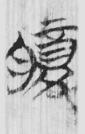腹
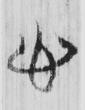心
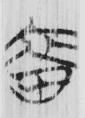{衣田}
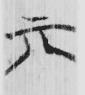亓
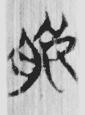{月 歺}
